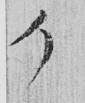人
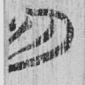勿
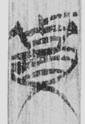貴
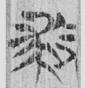救
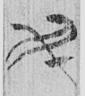民
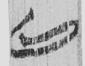㠯（以）
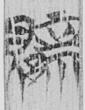○（辟）
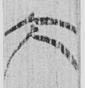大
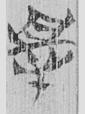辠（罪）
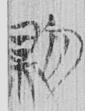則
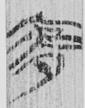夜（赦）
